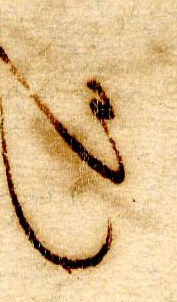To
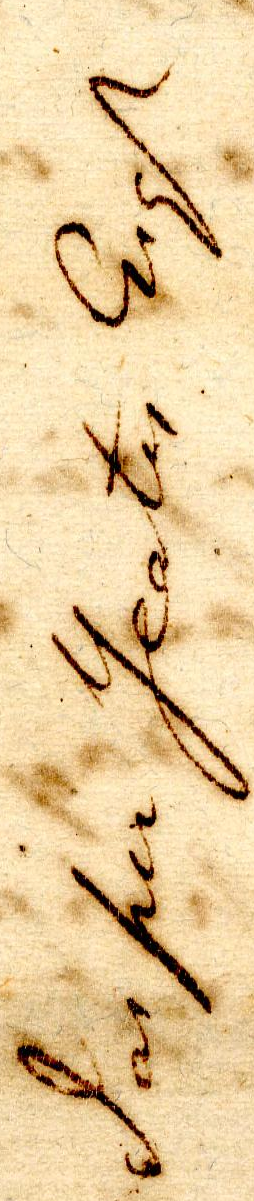Jasper Yeates Esq^r
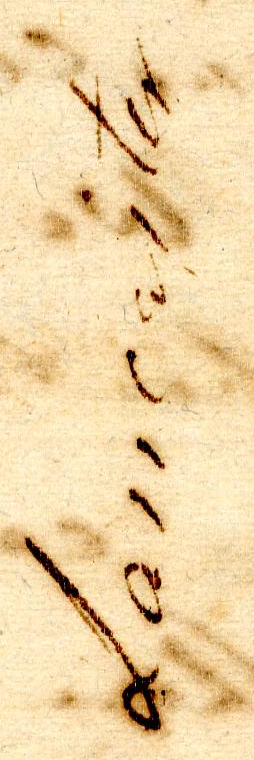Lancaster
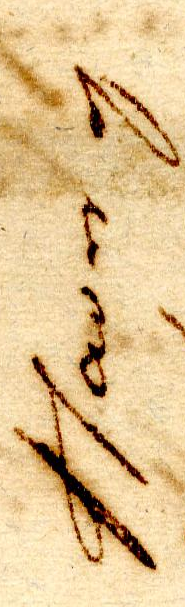Per favor of
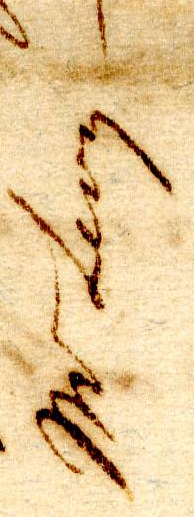M^r Levy
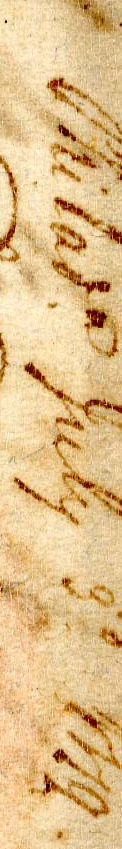Philad^a: July 3^d 1779
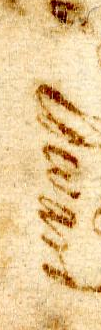Edward
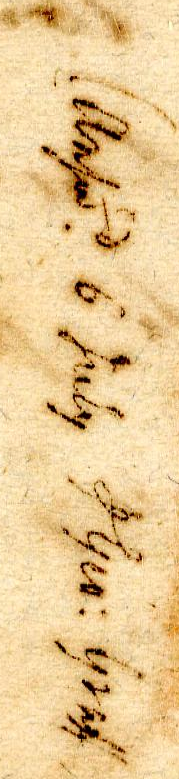(Answ^d. 6 July per Geo: Graff)
